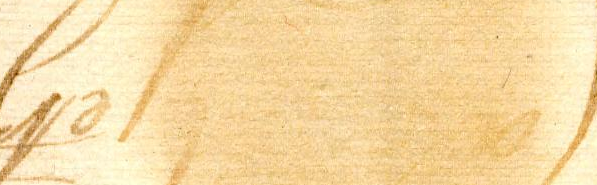Yetz
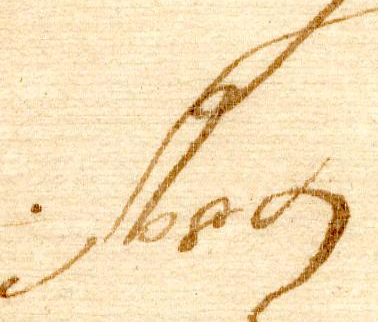Esq^r.
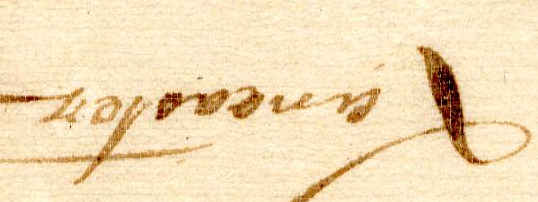Lancaster
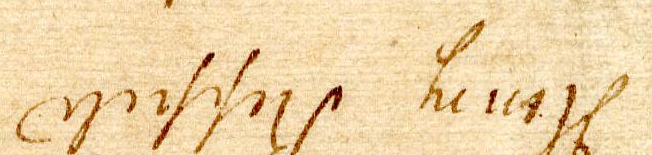Henry Keppele
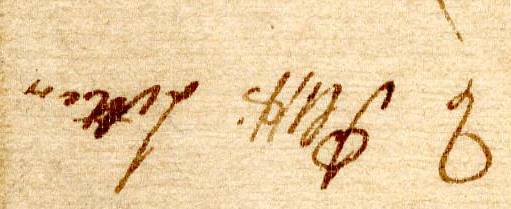Pltff's Letter
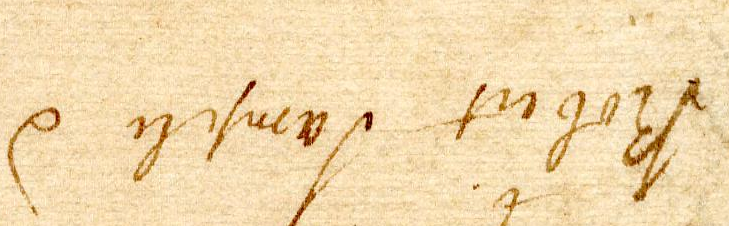Robert Sample
